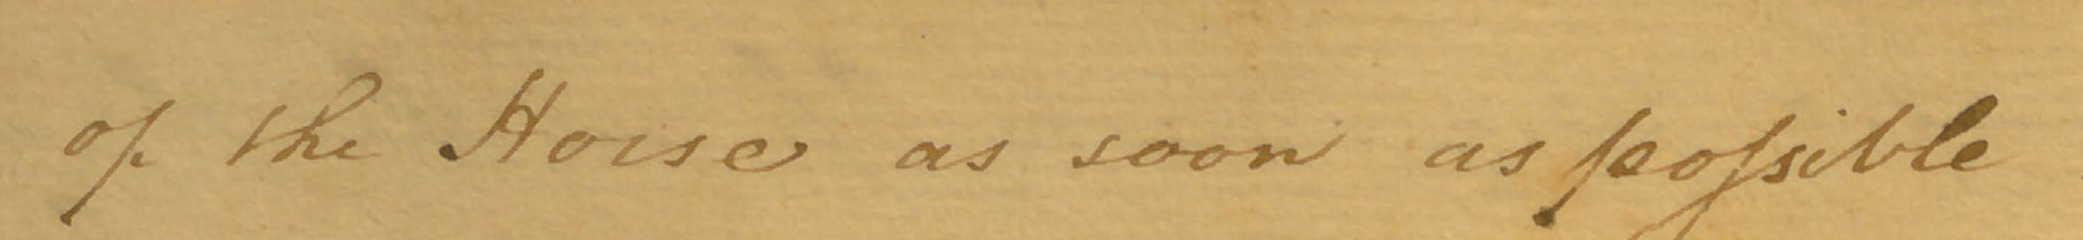of the Horse as soon as possible
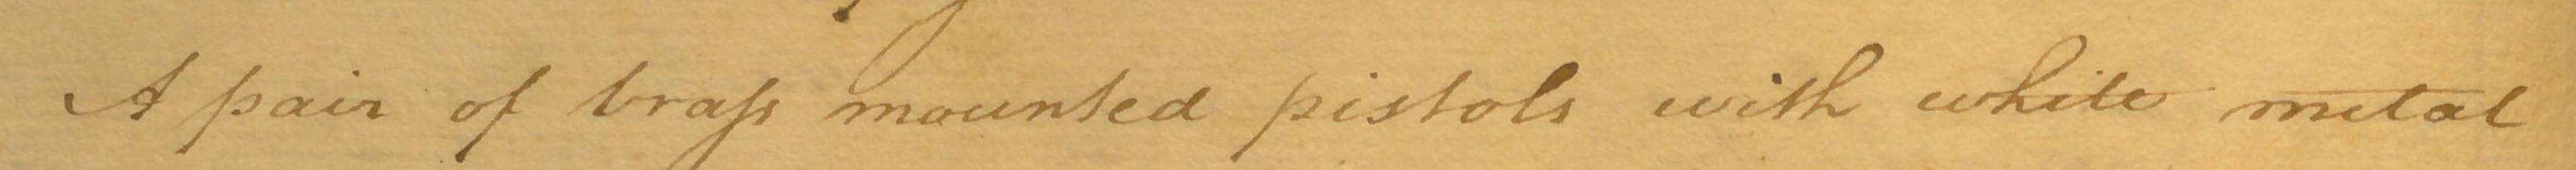A pair of brass mounted pistols with white metal
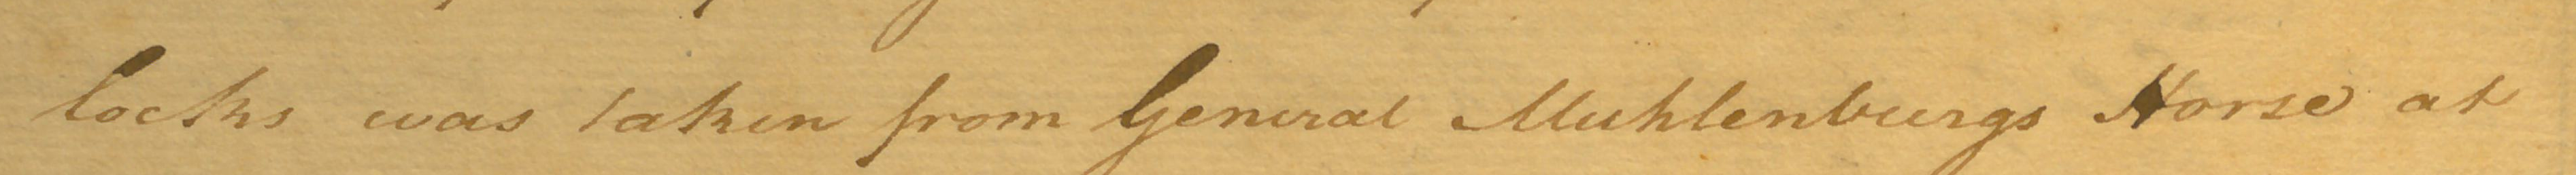locks was taken from General Muhlenburgs Horse at
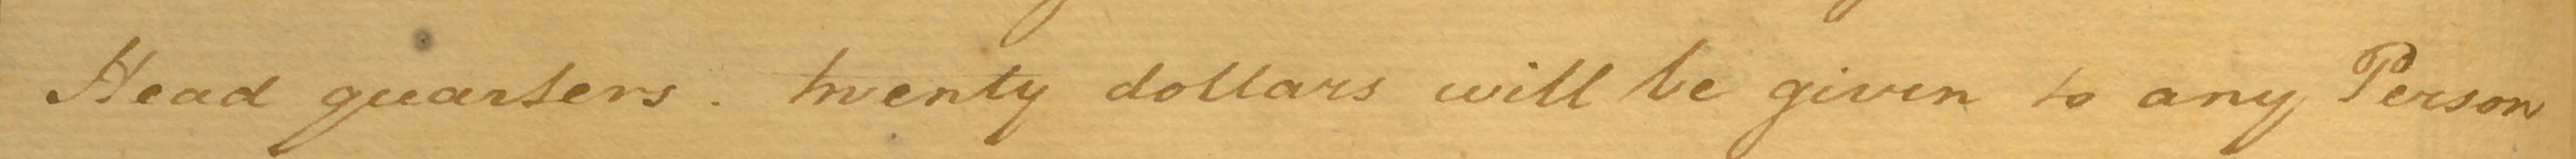Head quarters. twenty dollars will be given to any Person
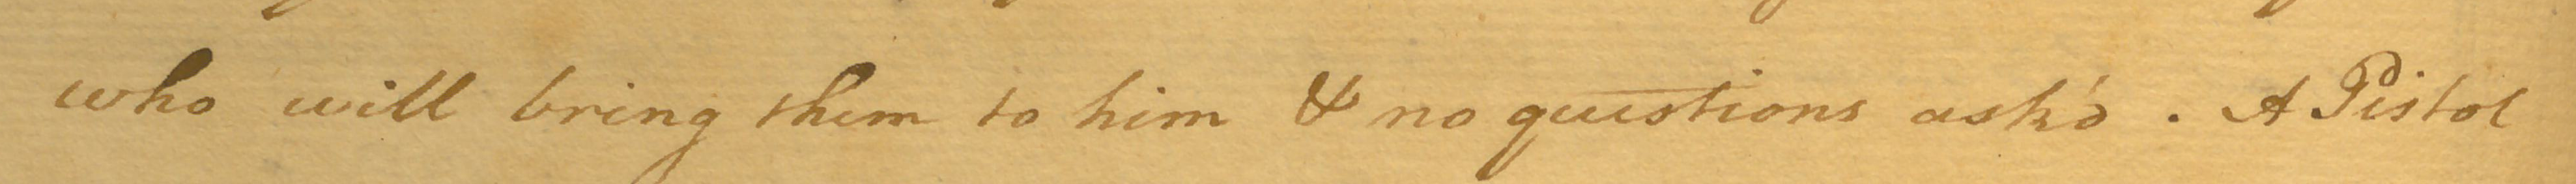who will bring them to him & no questions ask'd. A Pistol
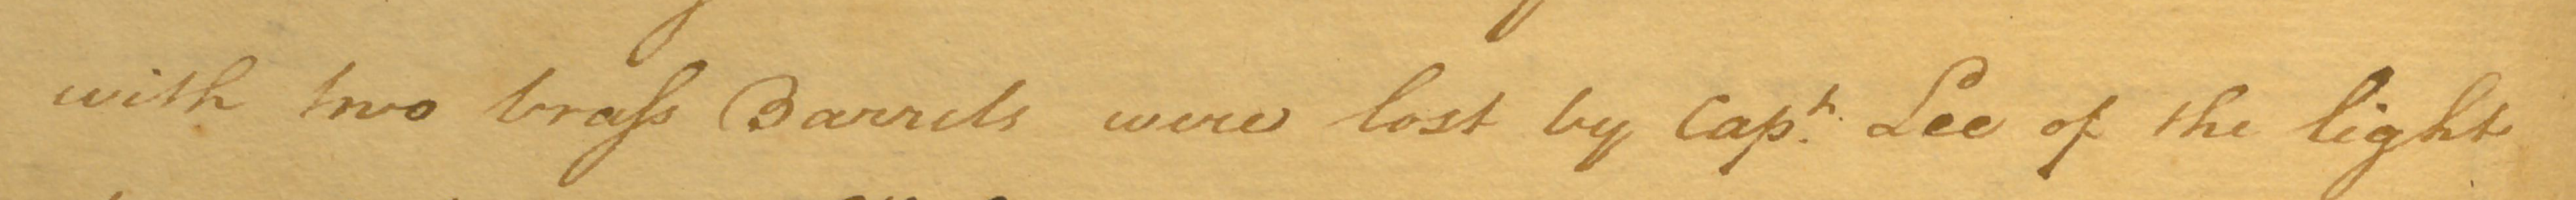with two brass Barrels were lost by Cap^t. Lee of the light
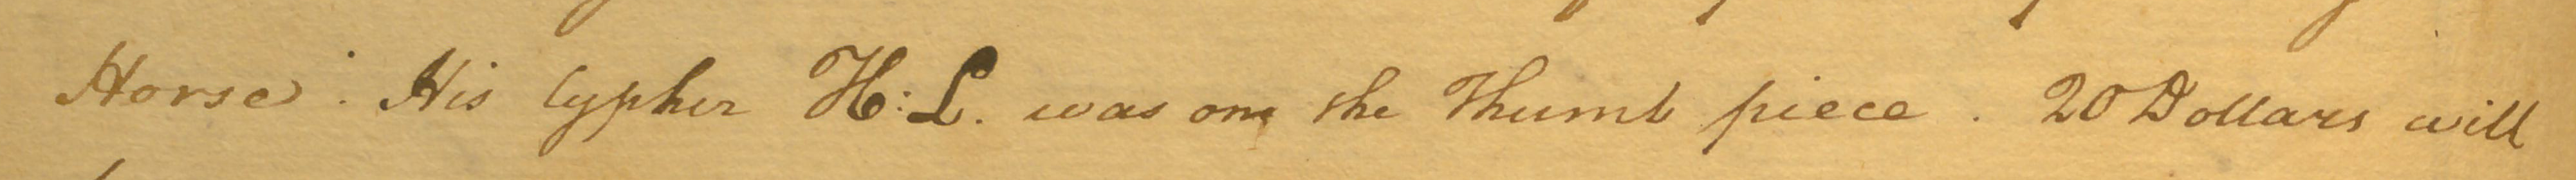Horse: His Cypher H: L. was on the Thumb piece. 20 Dollars will
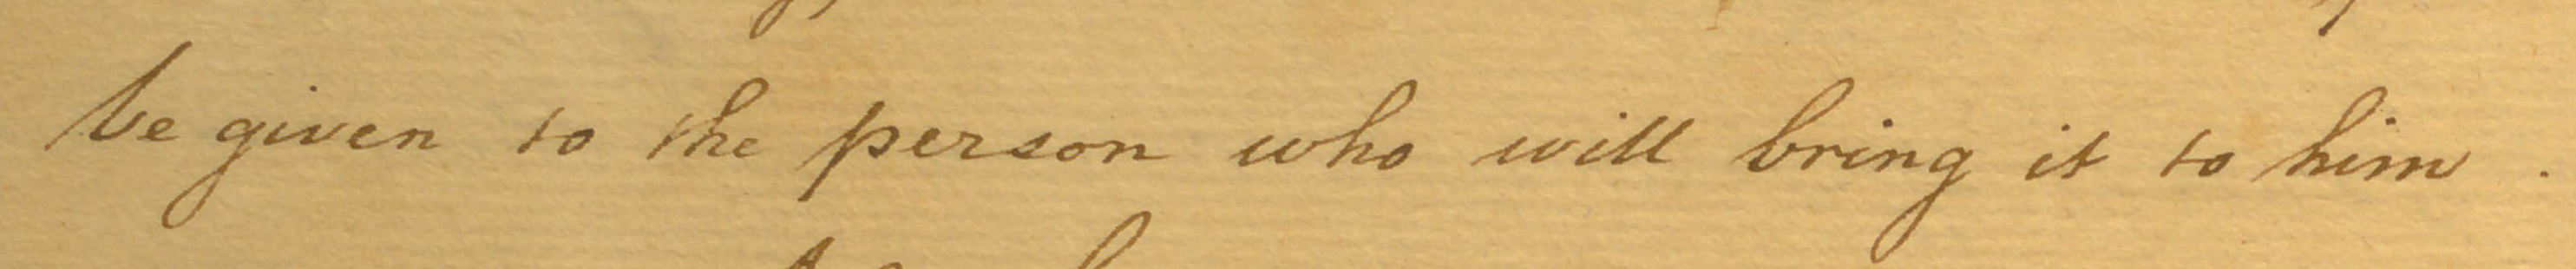be given to the person who will bring it to him
